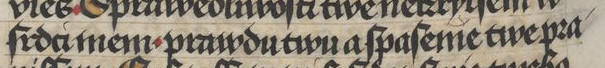ſrdci mem.prawdu twu a ſpaſeníe twe pra¬
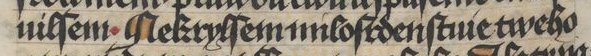uilſem.Nekrylſem miloſrdenſtuíe tweho
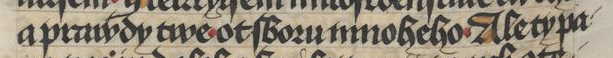a prawdy twe.otſboru mnoheho.Ale ty pa¬
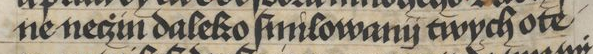ne necżin daleko ſmilowanij twych ote¬
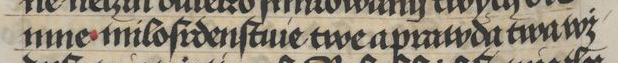mne.miloſrdenſtuíe twe a prawda twa wż¬
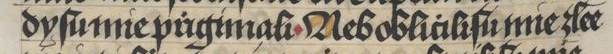dy ſu mie pṙigímali.Neb obliċiliſu mie zlee
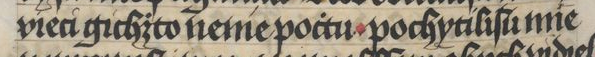vieci gichżto neníe poċtu.pochytiliſu mie
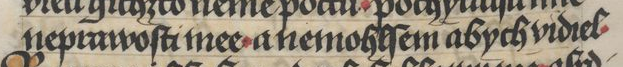neprawoſti mee.a nemohlſem abych vidiel.
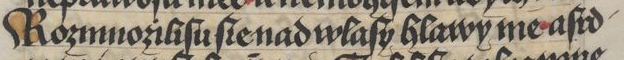Rozmnożiliſu nad wlaſy hlawy me.a ſrd¬
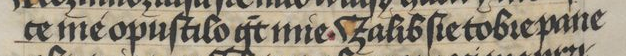ce mé opuſtilo ḡt mie.Zalib ſie tobie pane
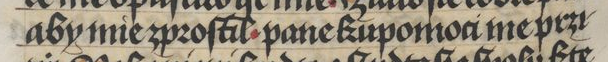aby mie zproſtil.pane kupomoci me przi¬
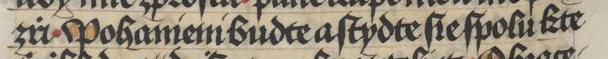zṙi.Pohaníení budte a ſtydte ſie ſpolu kte
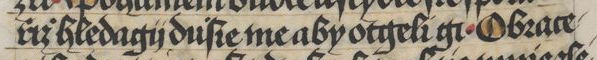ṙiż hledagij duẛie me aby otgeli gi.Obrace¬
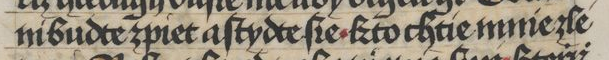ni budte zpiet aſtydte ſie.kto chtíe mnie zlé
